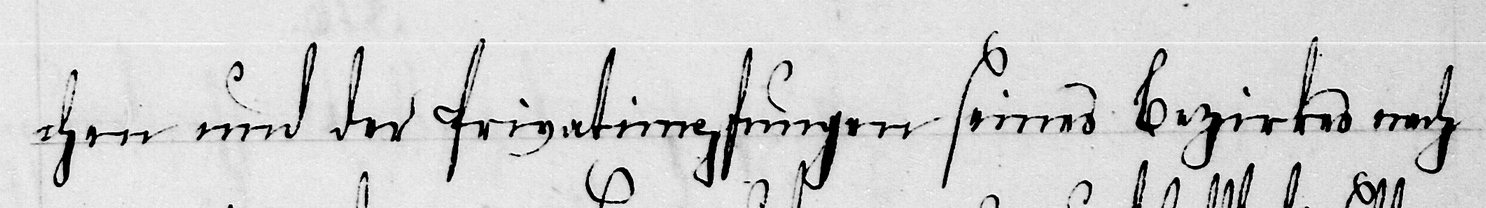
chen und der Privatimpfungen seines Bezirkes nach
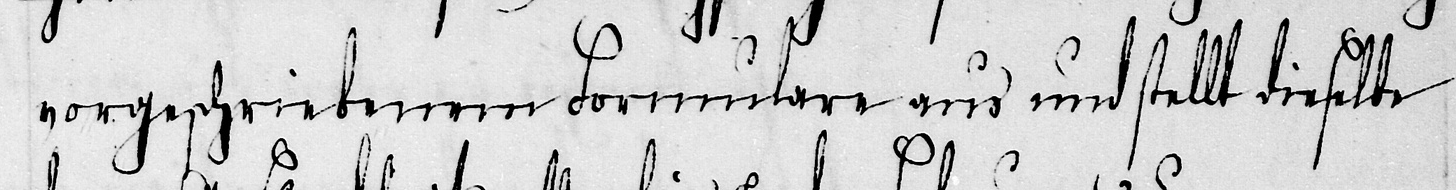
vorgeschriebenen Formulare aus und stellt dieselbe
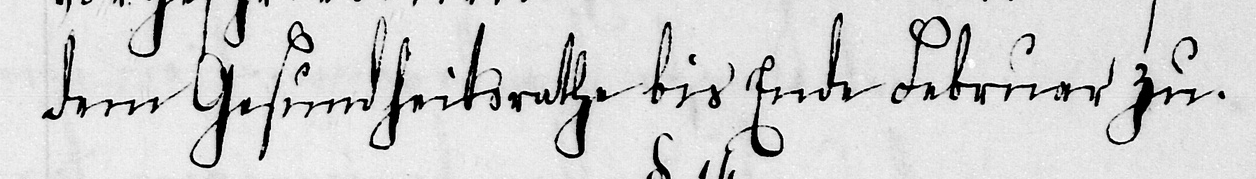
dem Gesundheitsrathe bis Ende Februar zu.
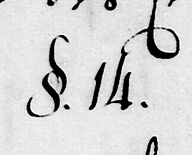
§. 14.
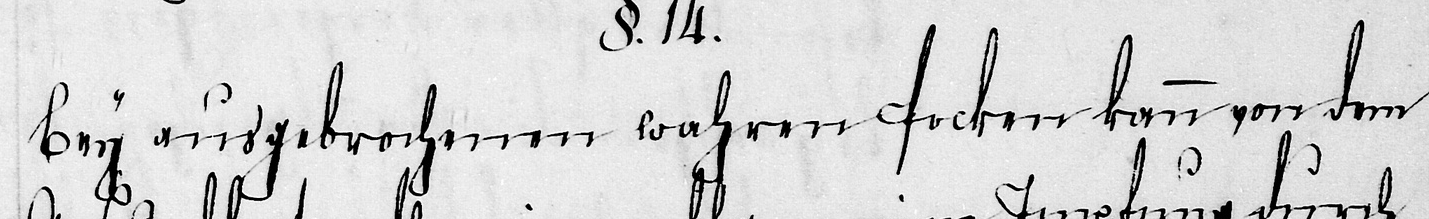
Bey ausgebrochenen wahren Pocken kann von dem
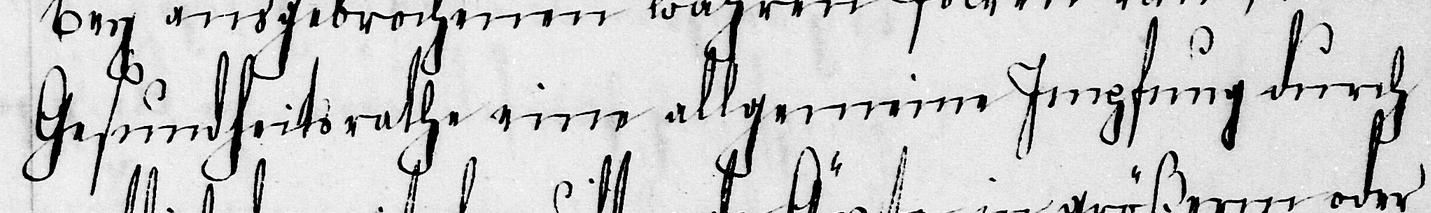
Gesundheitsrathe eine allgemeine Impfung durch
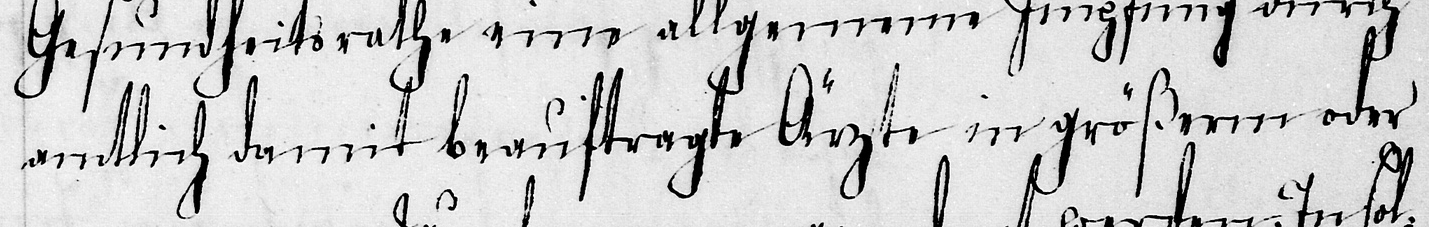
amtlich damit beauftragte Ärzte in größerm oder
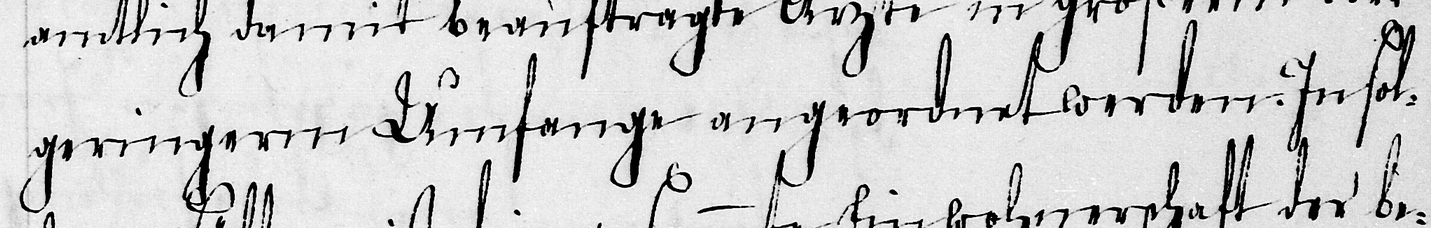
geringerm Umfange angeordnet werden. In sol¬
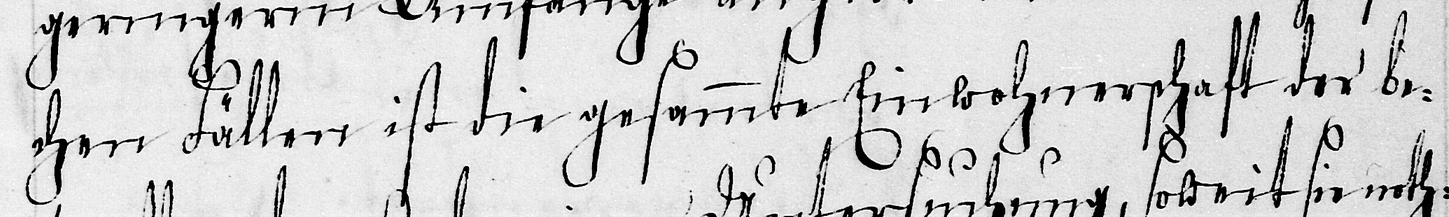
chen Fällen ist die gesammte Einwohnerschaft der be¬
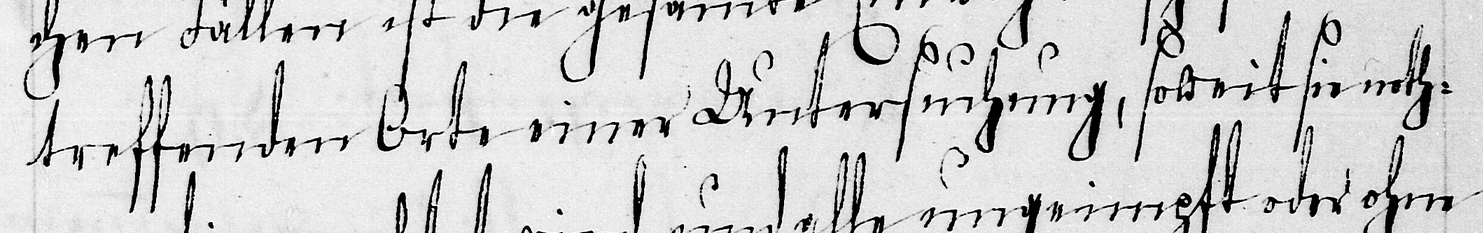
treffenden Orte einer Untersuchung, soweit sie noth¬
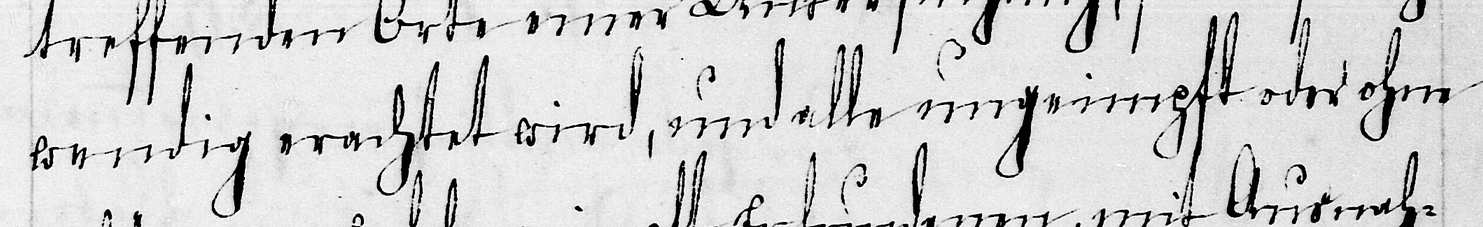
wendig erachtet wird, und alle ungeimpft oder ohne
